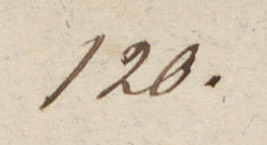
120.
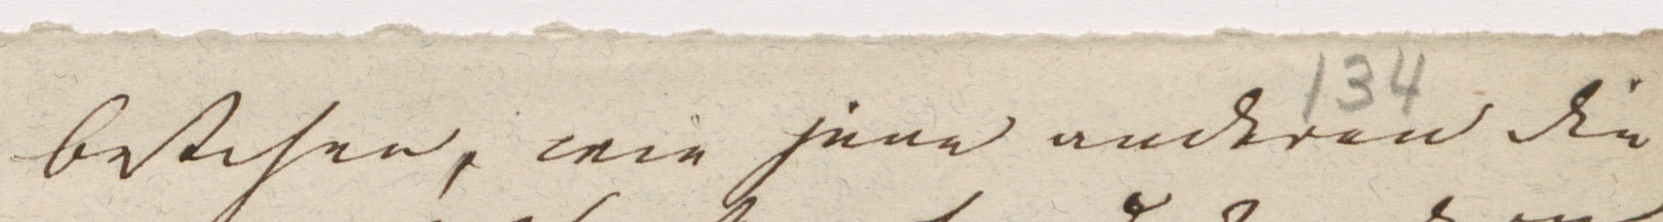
bestehen, wie jene anderen die
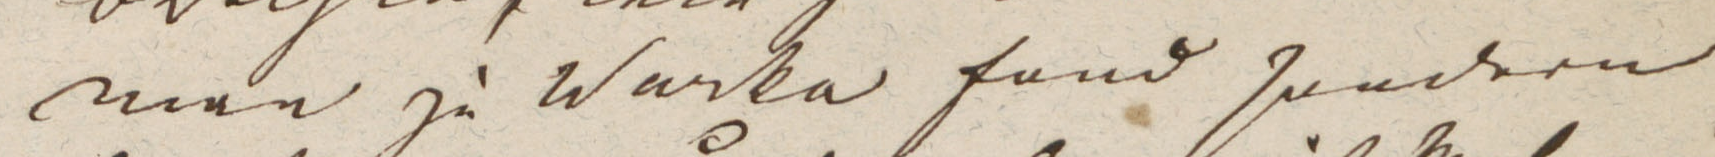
man zu Wurka fand sondern
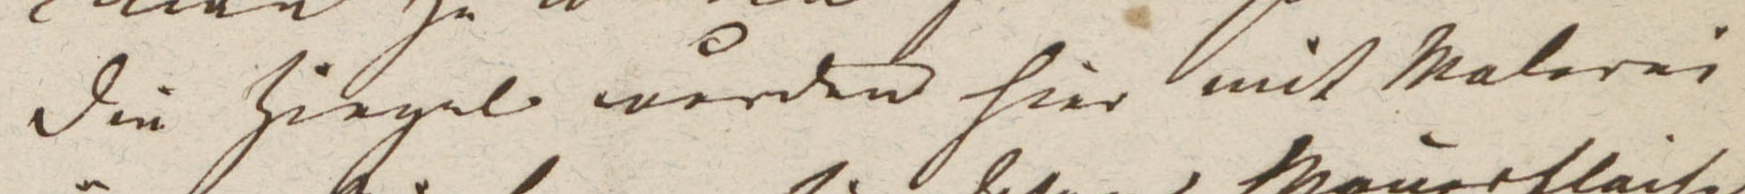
die Ziegel wurden hier mit Malerei
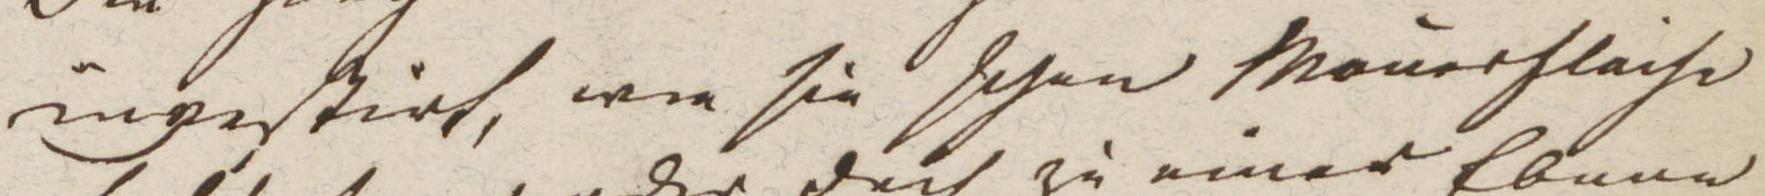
investirt, wie sie schon Mauerfläche
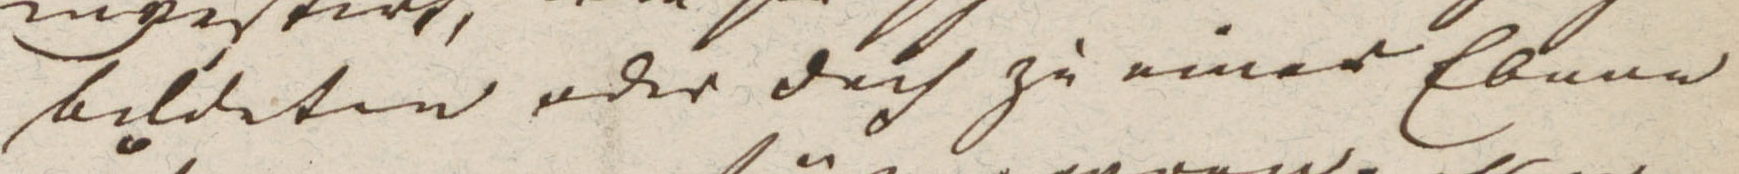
bildeten oder doch zu einer Ebene
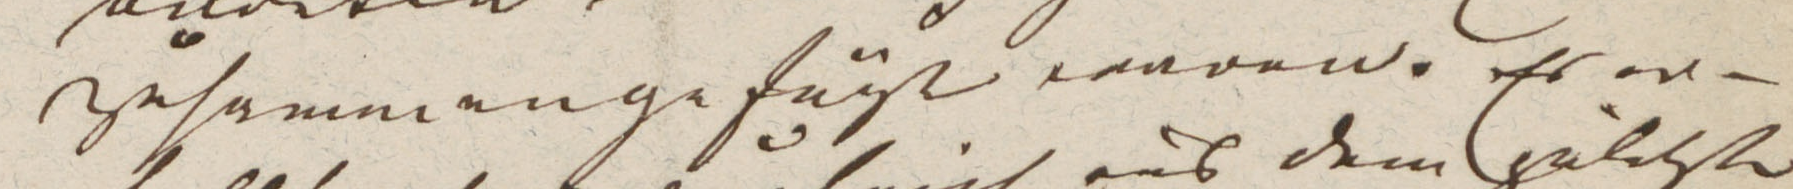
zusammengefügt waren. Es er-
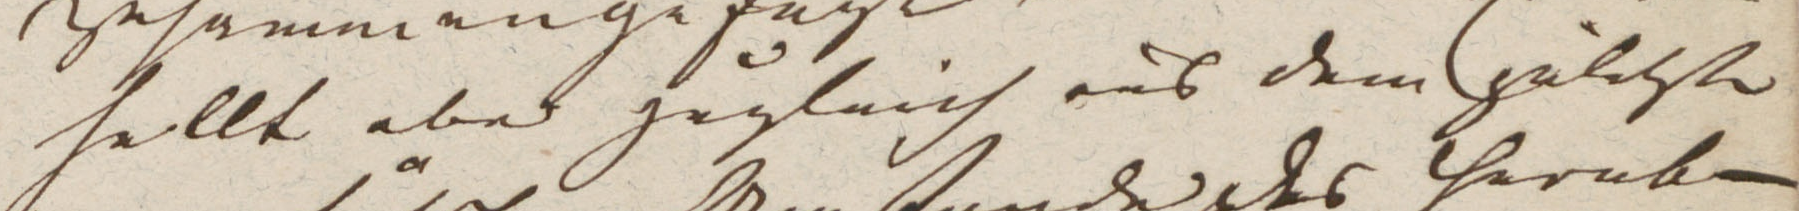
hellt aber zugleich aus dem zuletzt
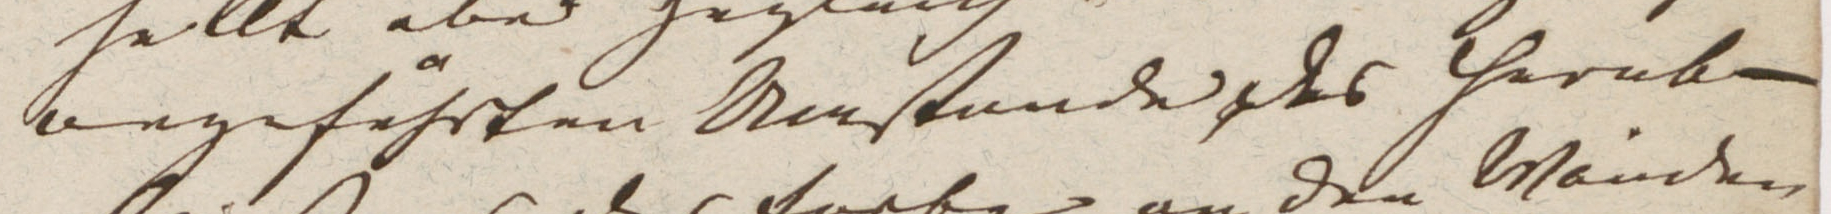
angeführten Umstande, des Herab-
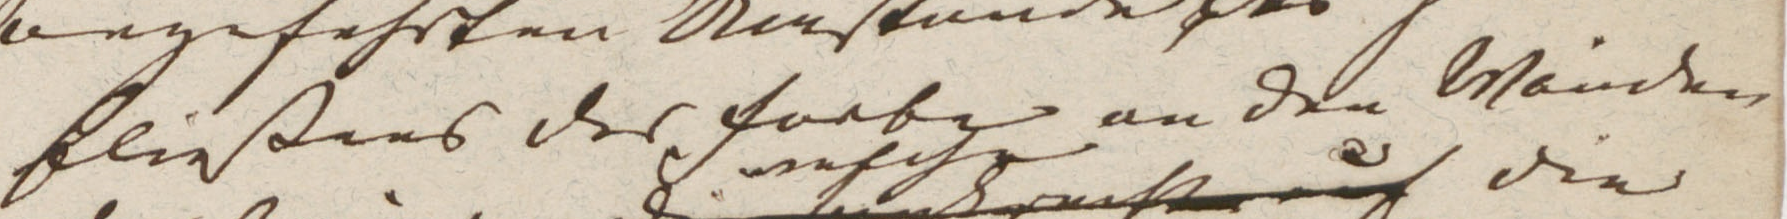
fliessens der Farbe an den Wänden
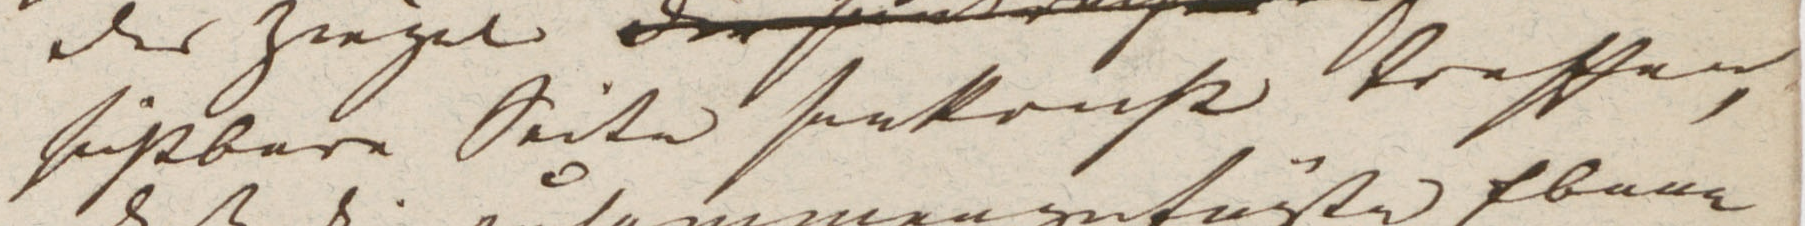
sichtbare Seite senkrecht treffen,
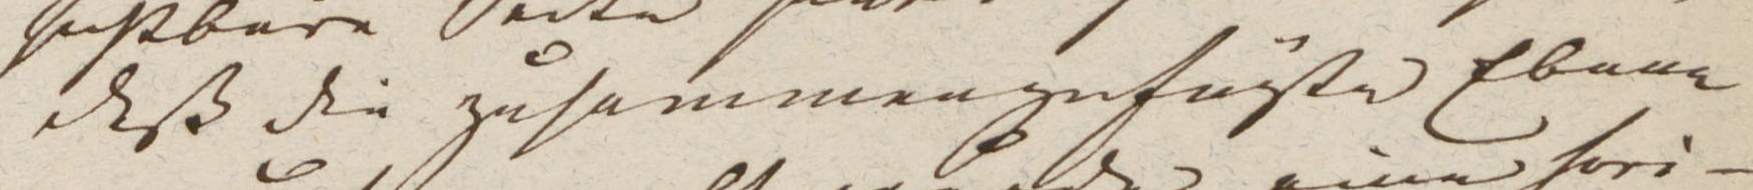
dass die zusammengefügte Ebene
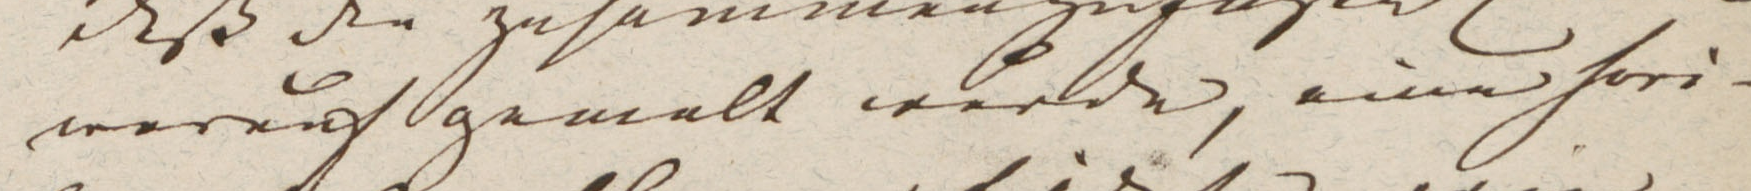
worauf gemalt wurde, eine hori-
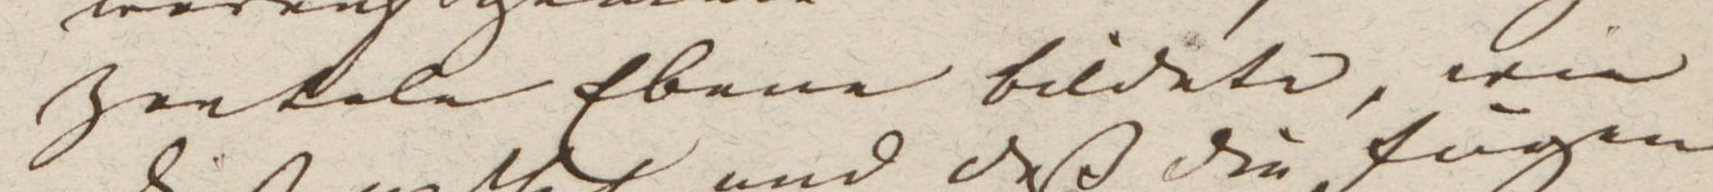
zontale Ebene bildete, wie
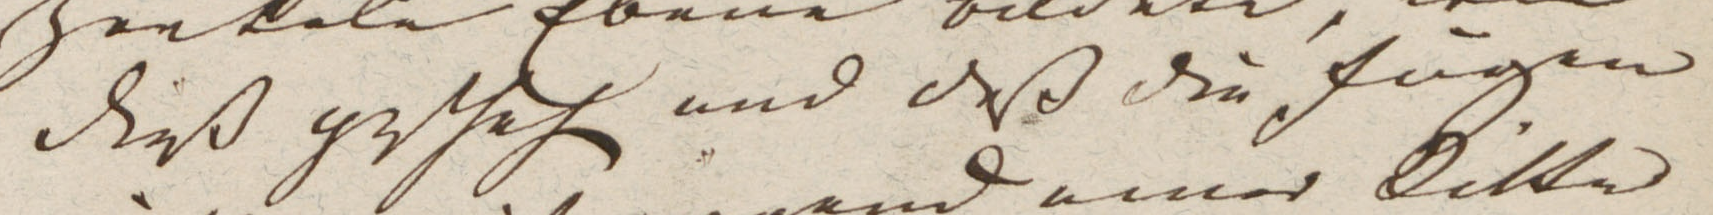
diess geschah und dass die Fugen
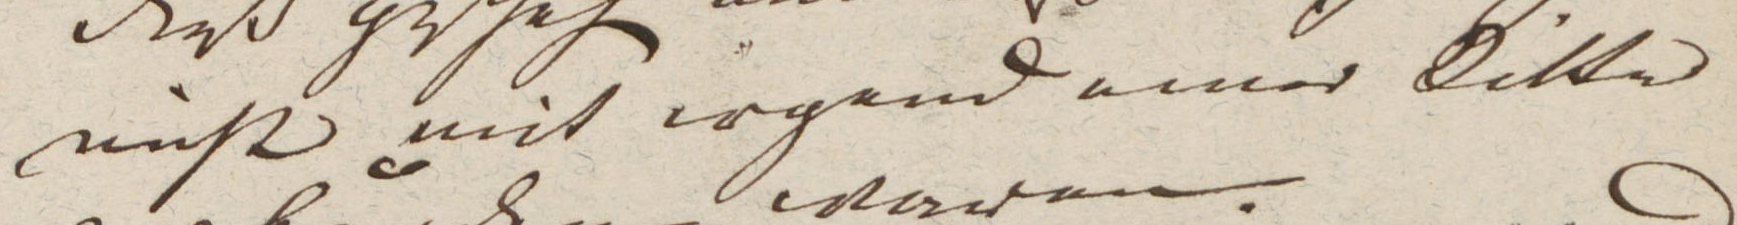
nicht mit irgend einer Kitte
